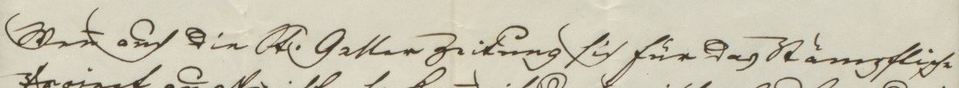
Wenn auch die St. Galler Zeitung sich für das Stämpflische
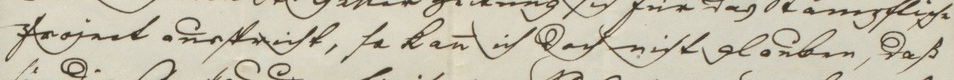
Projekt ausspricht, so kann ich doch nicht glauben, daß
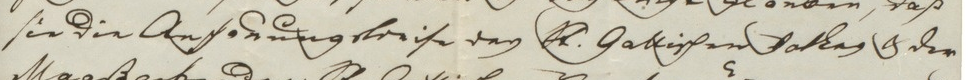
sie die Anschauungsweise des St. Gallischen Volkes & der
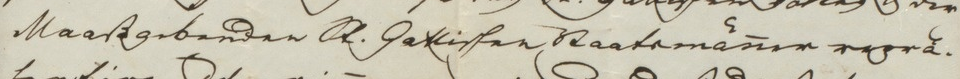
Maaßgebenden St. Gallischen Staatsmänner reprä-
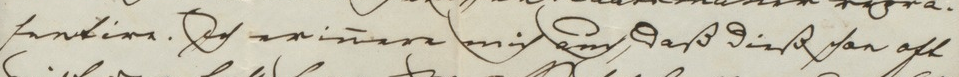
sentire. Ich erinnere mich auch, daß dieß schon oft
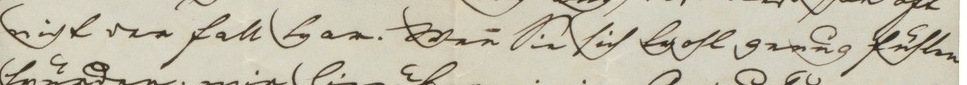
nicht der Fall war. Wenn Sie sich wohl genug fühlen
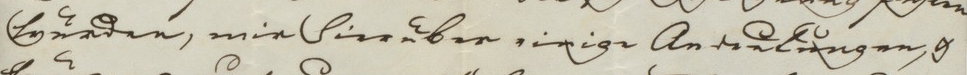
würden, mir hierüber einige Andeutungen, &
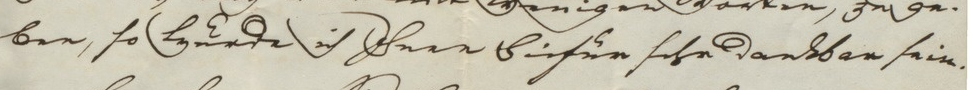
ben, so würde ich Ihnen hiefür sehr dankbar sein.
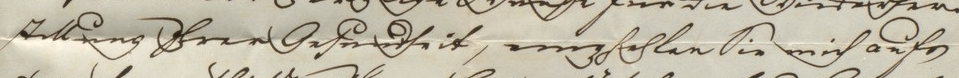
stellung Ihrer Gesundheit, empfehlen Sie mich aufs
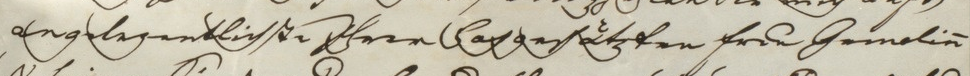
angelegentlichste Ihrer hochgeschätzten Frau Gemalinn
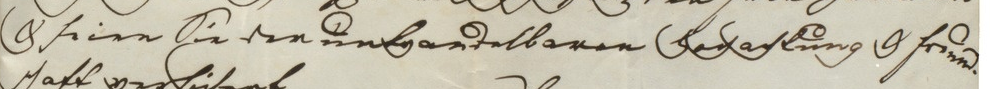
& seien Sie der unwandelbaren Hochachtung & Freund-
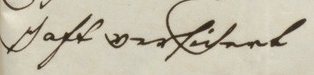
schaft versichert
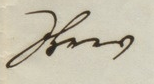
Ihres
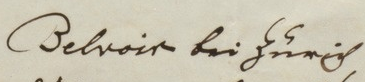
Belvoir bei Zürich
